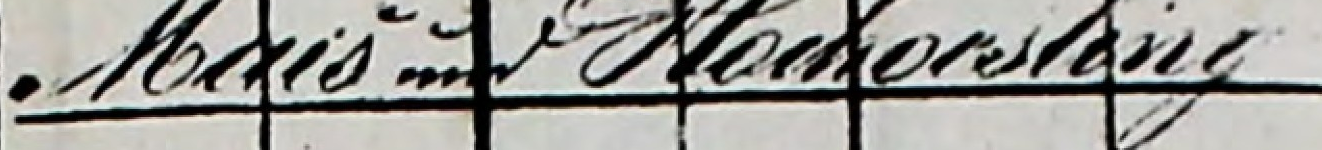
Mais und Hochoesling
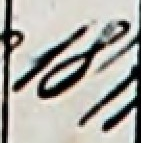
18
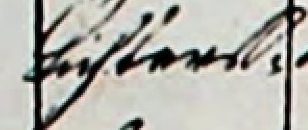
Lichters„
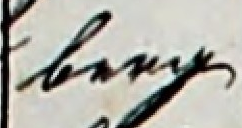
berg
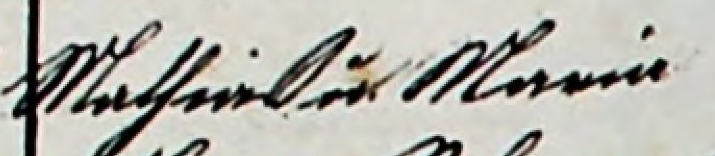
Mathias u. Maria
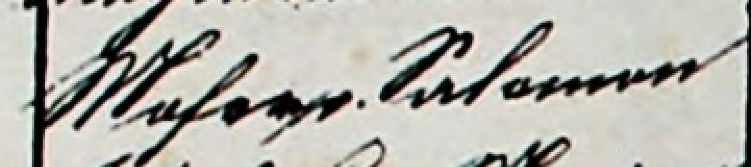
Moser v. Salomon
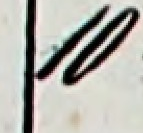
10
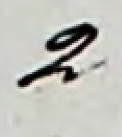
2
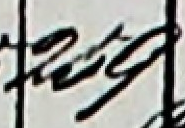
259
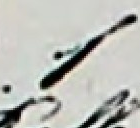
1
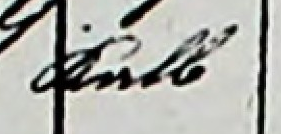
Kalb
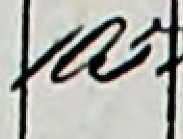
105
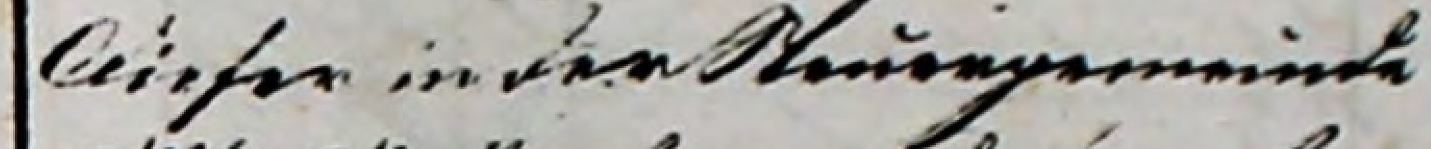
Dieser in der Steuergemeinde
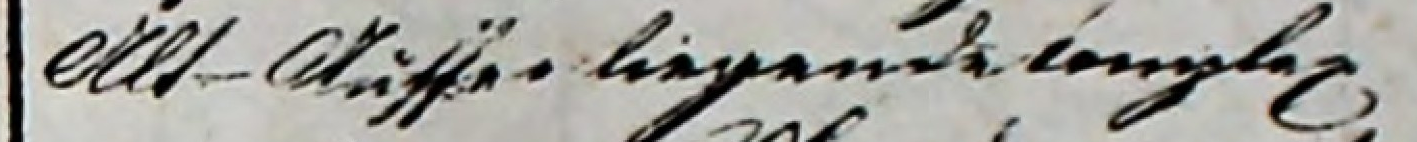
Alt-Aussee liegende Complex
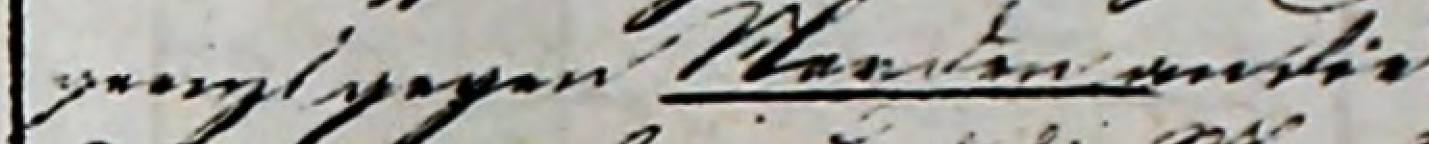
grenzt gegen Norden an die
